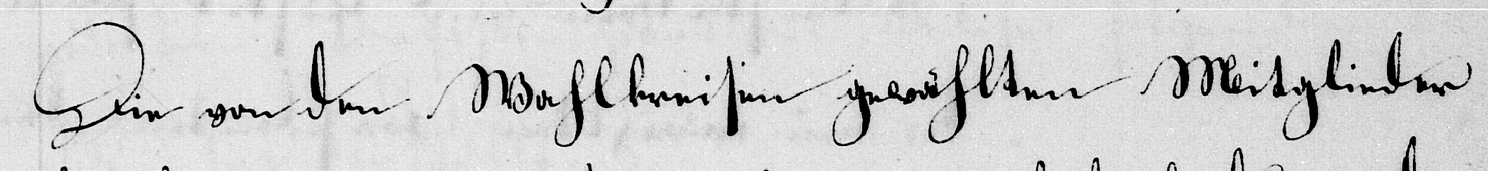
Die von den Wahlkreisen gewählten Mitglieder
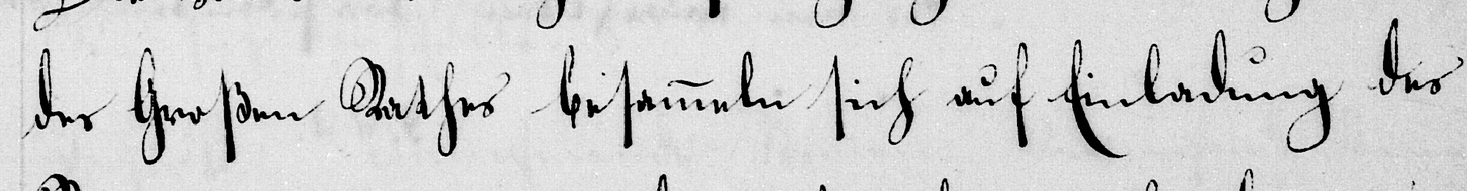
des Großen Rathes besammeln sich auf Einladung des
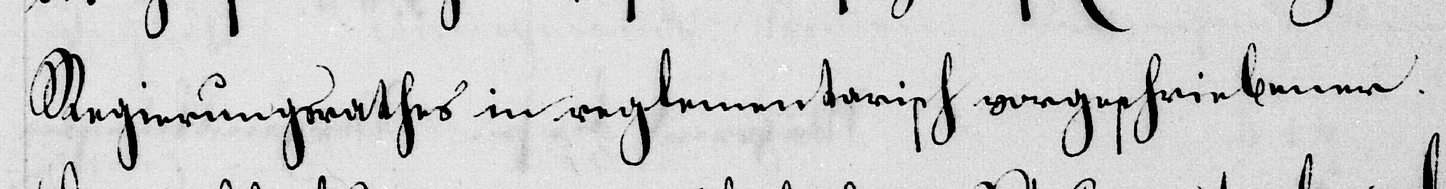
Regierungsrathes in reglementarisch vorgeschriebener
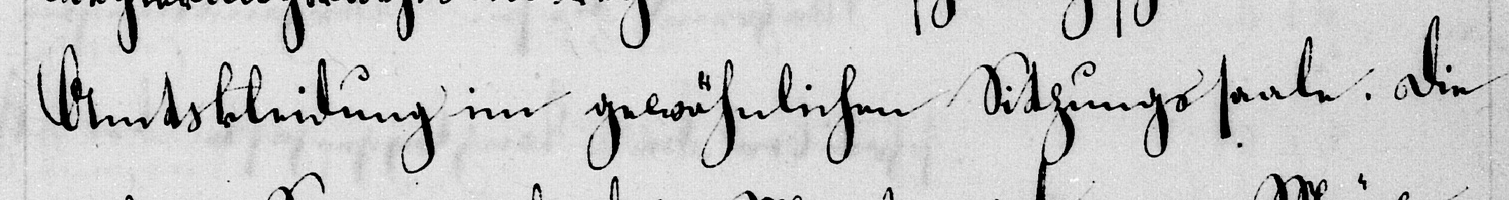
Amtskleidung im gewöhnlichen Sitzungssaale. Die
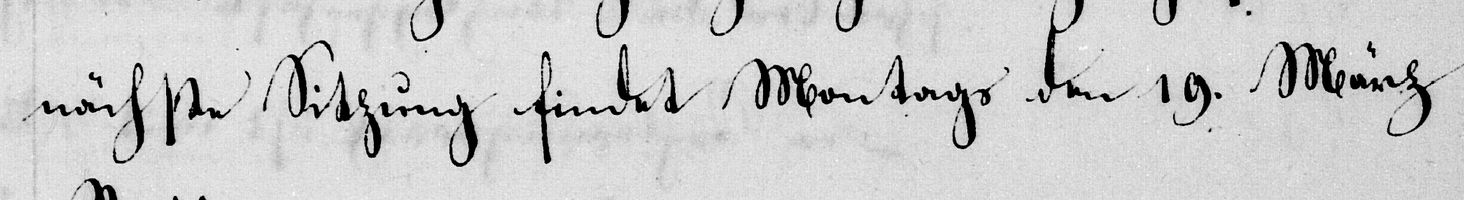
nächste Sitzung findet Montags den 19. März
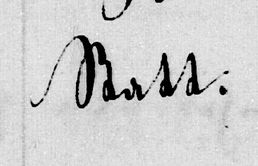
Statt.
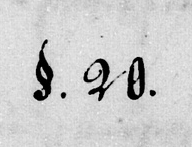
§.20.
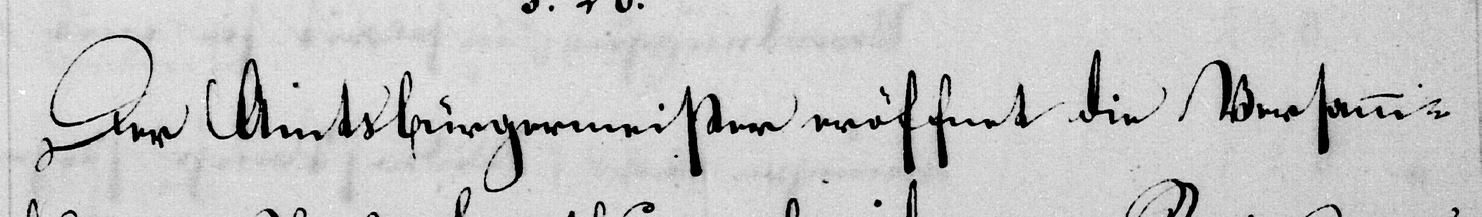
Der Amtsbürgermeister eröffnet die Versamm¬
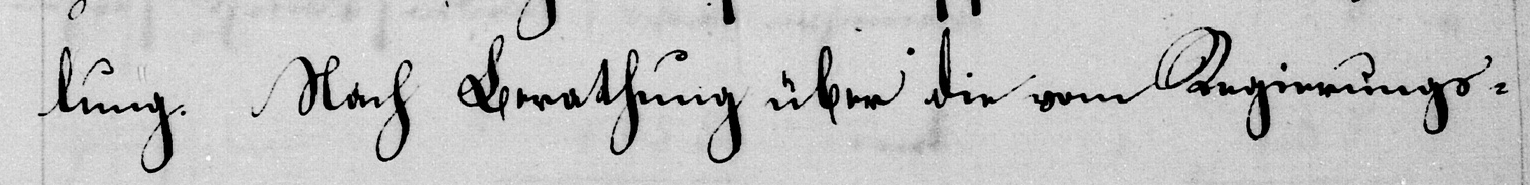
lung. Nach Berathung über die vom Regierungs-
